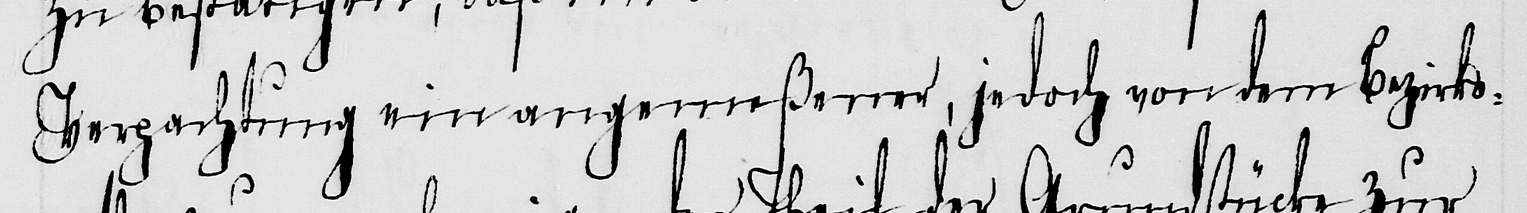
Verpachtung ein angemeßener, jedoch von dem Bezirks¬
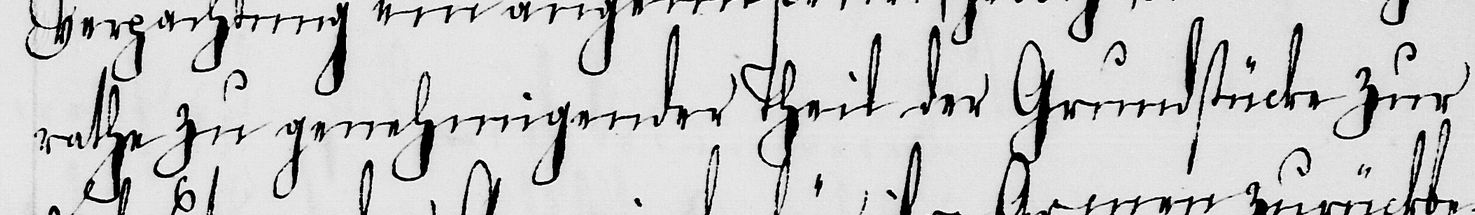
rathe zu genehmigender Theil der Grundstücke zur
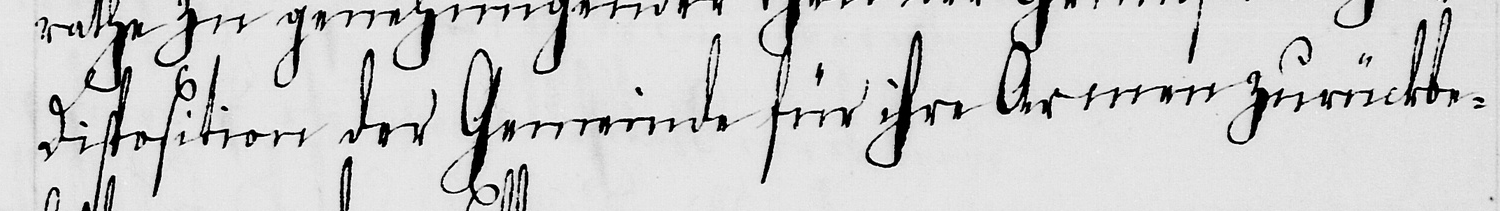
Disposition der Gemeinde für ihre Armen zurückbe¬
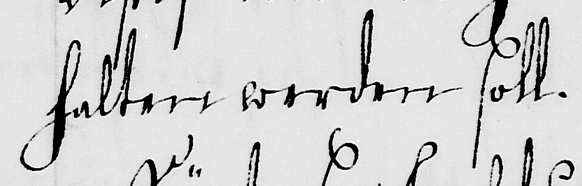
halten werden soll.
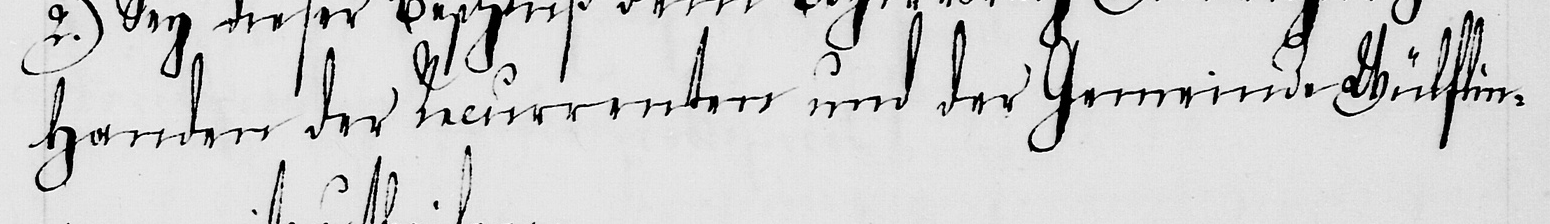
Handen der Recurrenten und der Gemeinde Wülflin¬
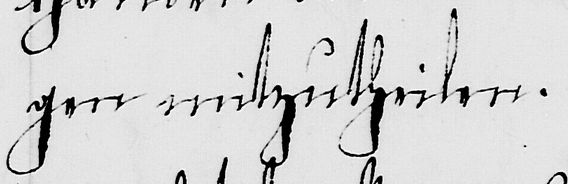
gen mitzutheilen.
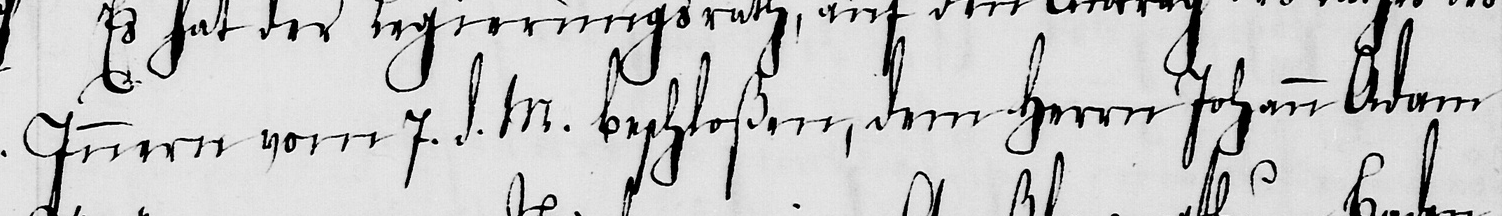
Innern vom 7. d. M. beschloßen, dem Herrn Johann Adam
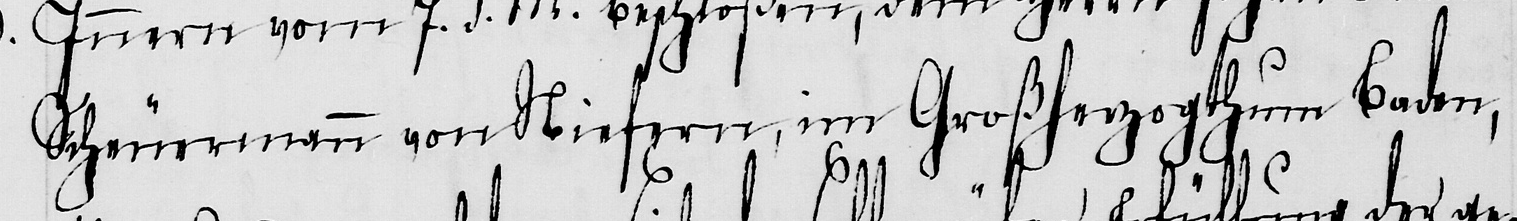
Scheuermann von Niefern, im Großherzogthum Baden,
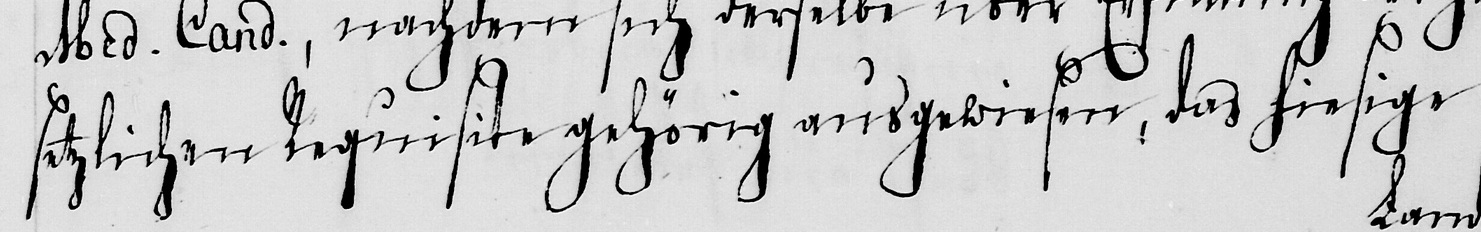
etzlichen Requisite gehörig ausgewiesen, das hiesige
